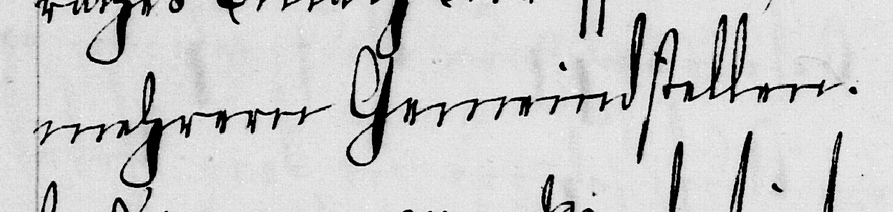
mehrern Gemeindstellen.
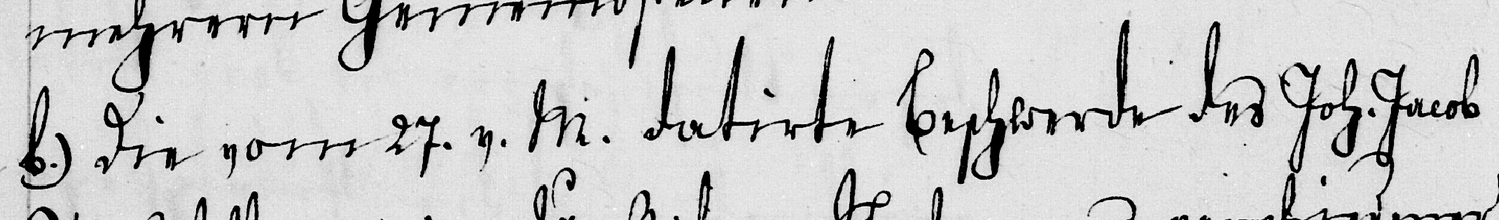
b.) Die vom 27. d. M. datirte Beschwerde des Joh. Jacob
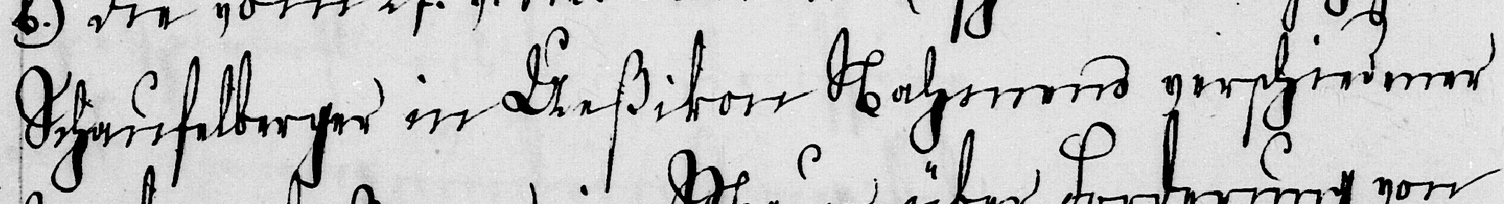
Schaufelberger in Ueßikon Nahmens verschiedener
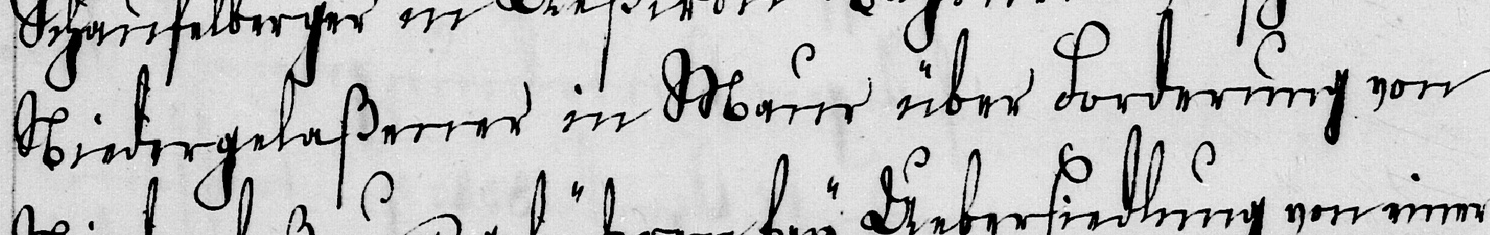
Niedergelaßener in Maur über Forderung von
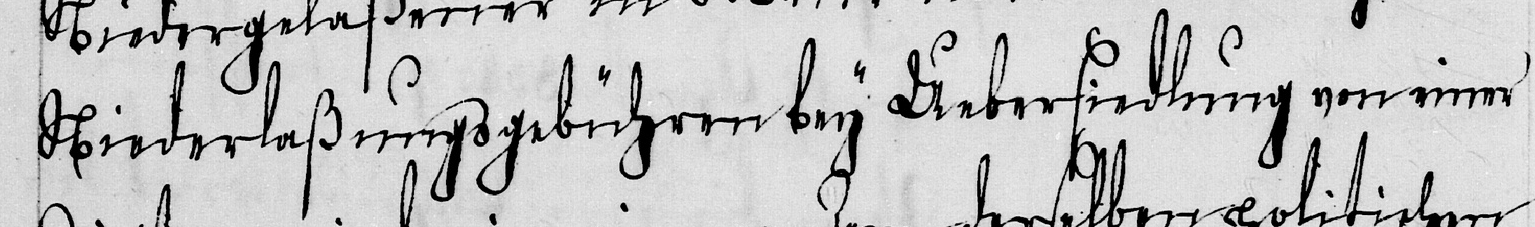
Niederlaßungsgebühren bey Uebersiedlung von einer
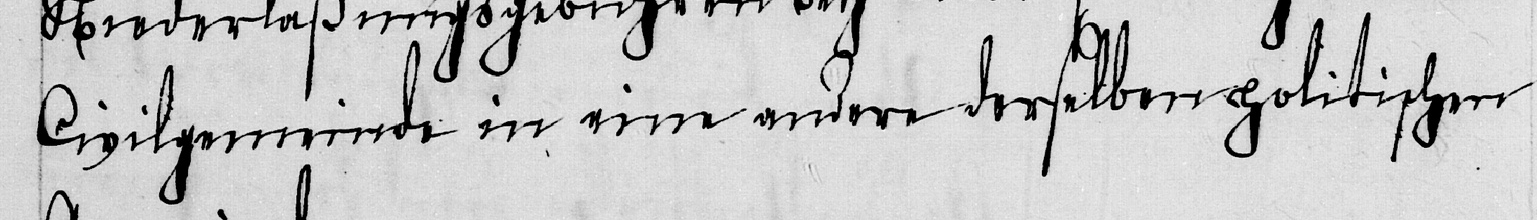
Civilgemeinde in eine andere derselben politischen
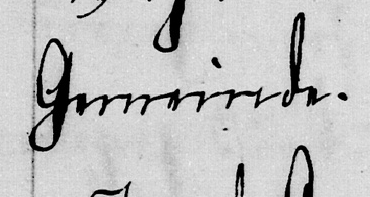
Gemeinde.
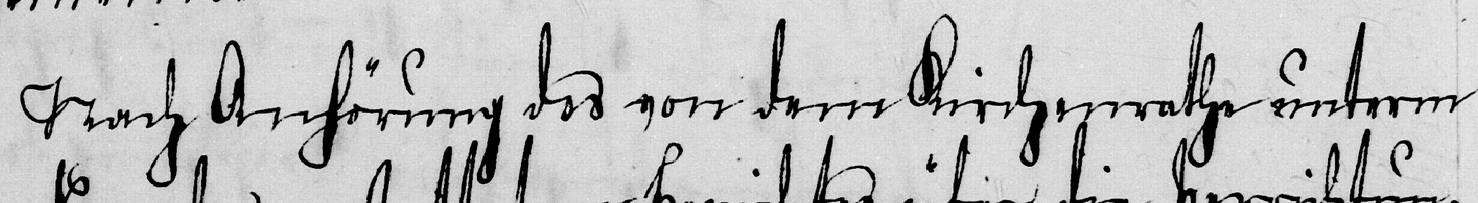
Nach Anhörung des von dem Kirchenrathe unterm
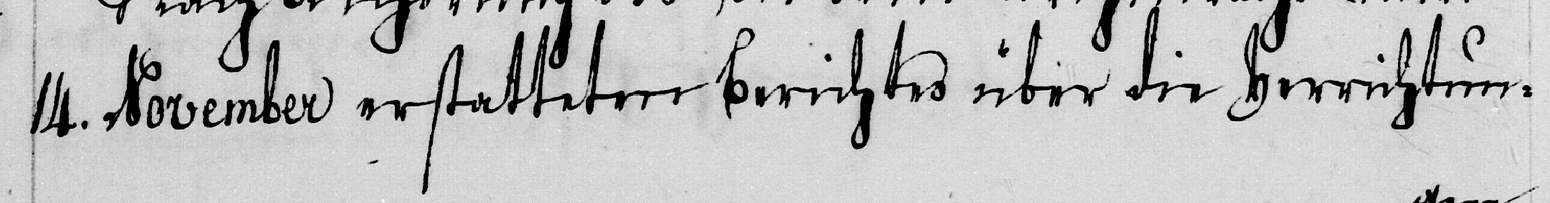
14. November erstatteten Berichtes über die Verrichtun
